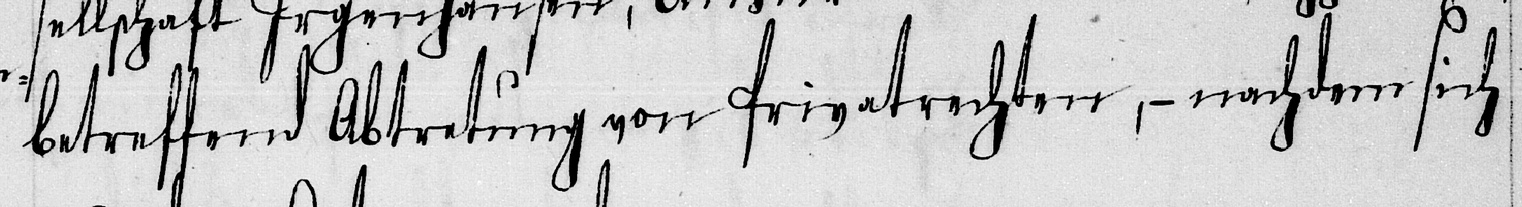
betreffend Abtretung von Privatrechten, – nachdem sich
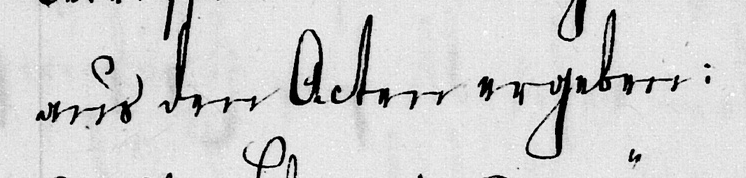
aus den Acten ergeben:
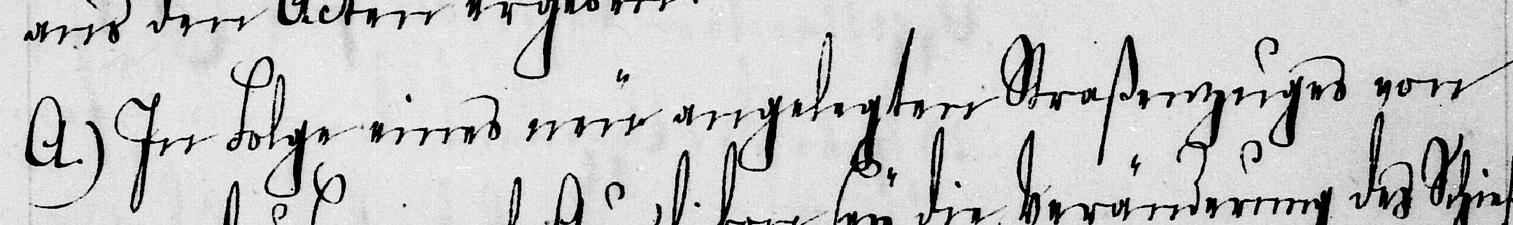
A.) In Folge eines neu angelegten Straßenzuges von
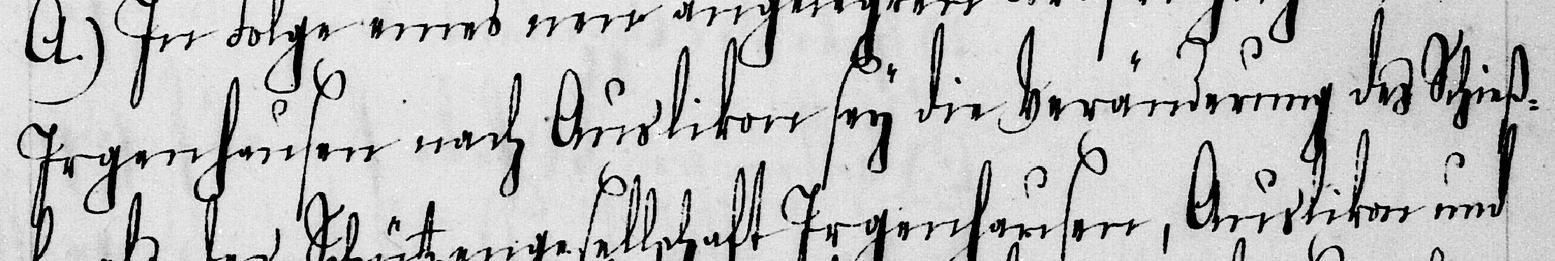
Irgenhausen nach Auslikon sey die Veränderung des Schie¬
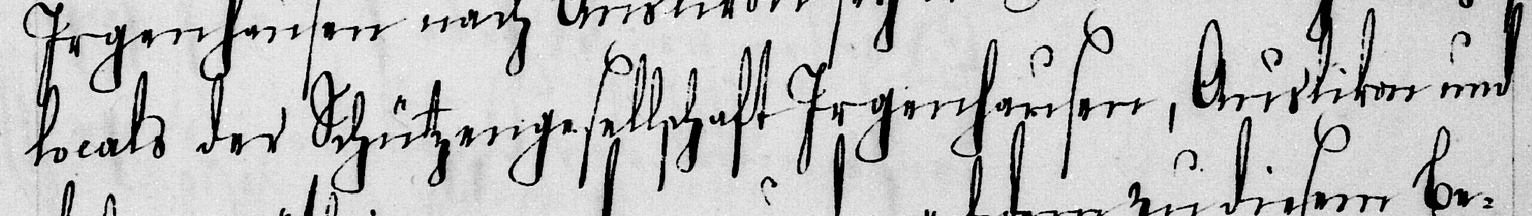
locals der Schützengesellschaft Irgenhausen, Auslikon und
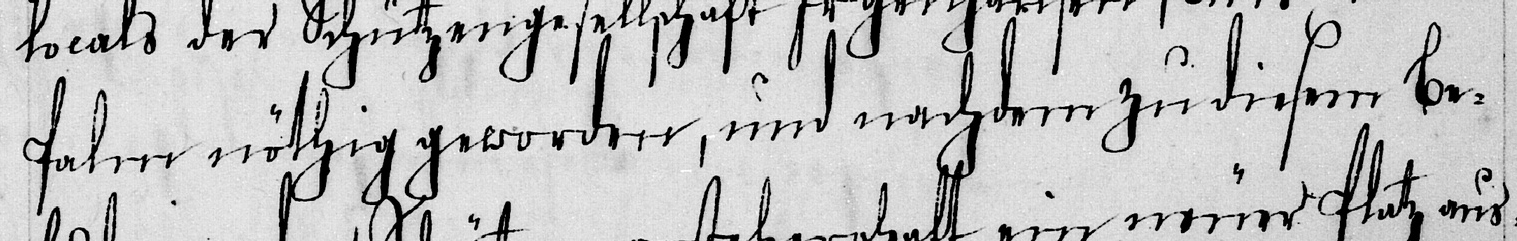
Palm nöthig geworden, und nachdem zu diesem Be¬
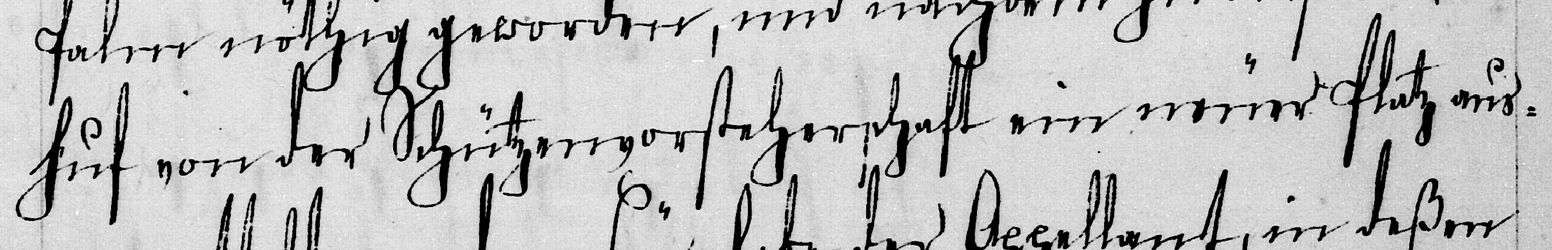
huf von der Schützenvorsteherschaft ein neuer Platz aus¬
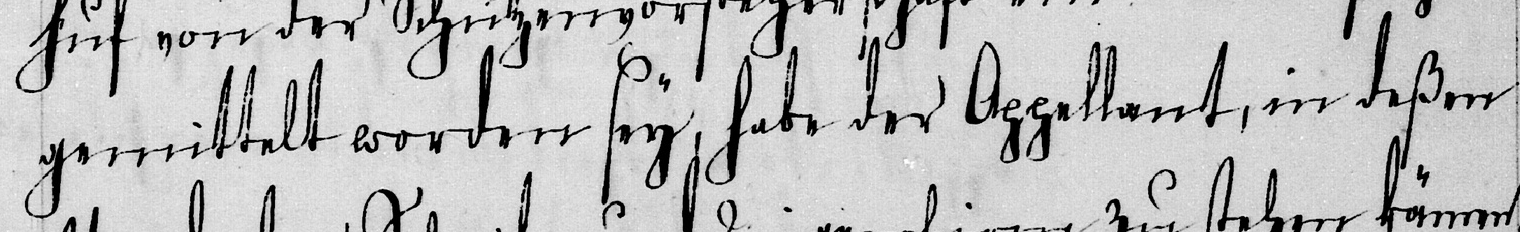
gemittelt worden sey, habe der Appellant, in deßen
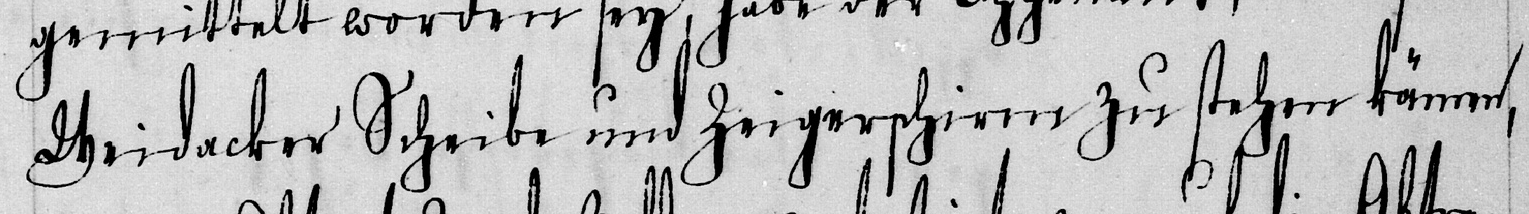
Weidacker Scheibe und Zeigerschirm zu stehen kämen,
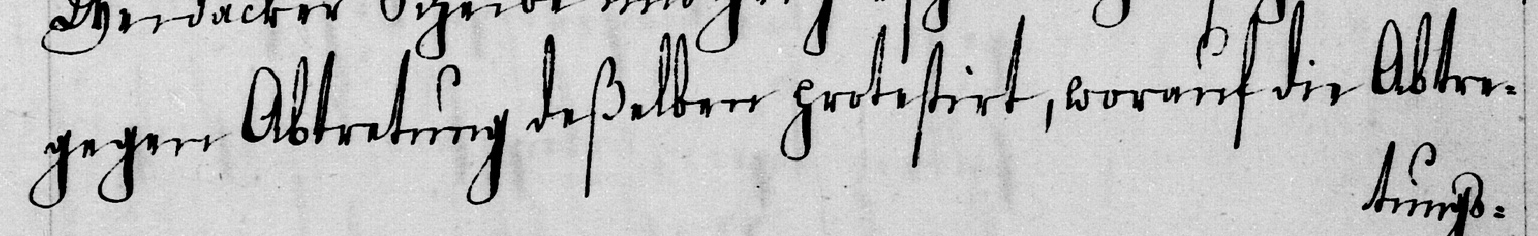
gegen Abtretung deßelben protestirt, worauf die Abtre-
